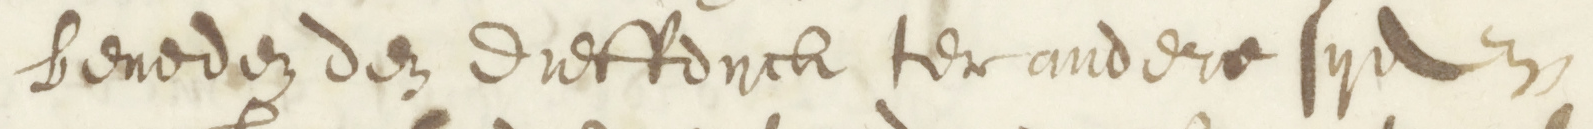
beneden den dieffdyck ter andere syden,
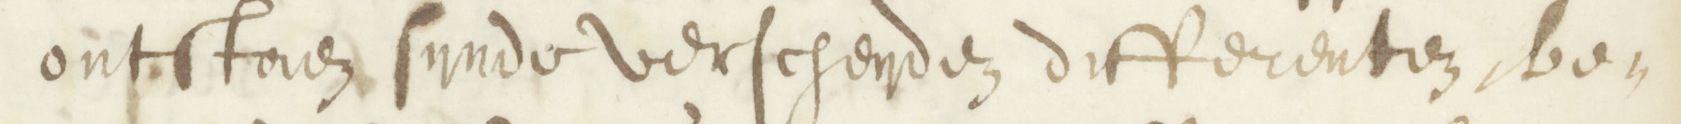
ontstaen synde verscheyden differenten, be,,
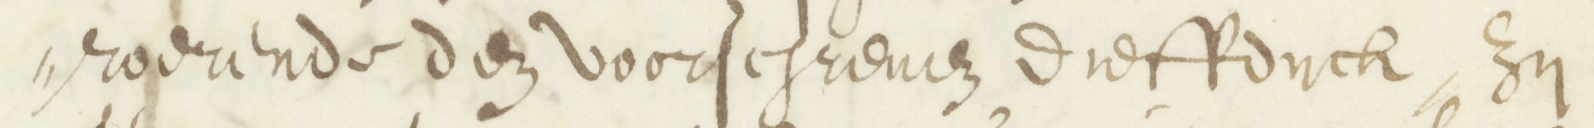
,,roerende den voorschreuen dieffdyck, zy
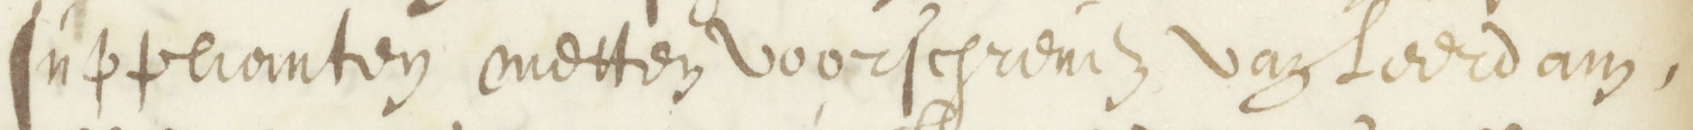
supplianten metten voorschreuen van Leerdam,
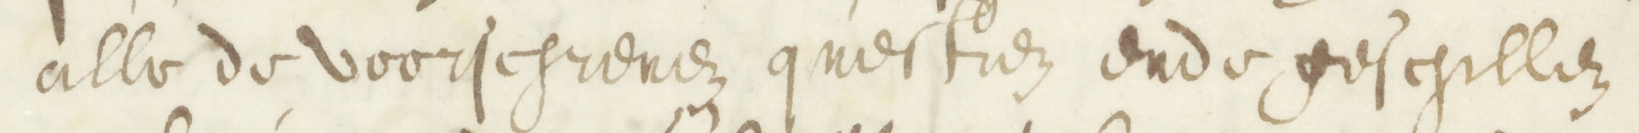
alle de voorschreuen questien ende geschillen
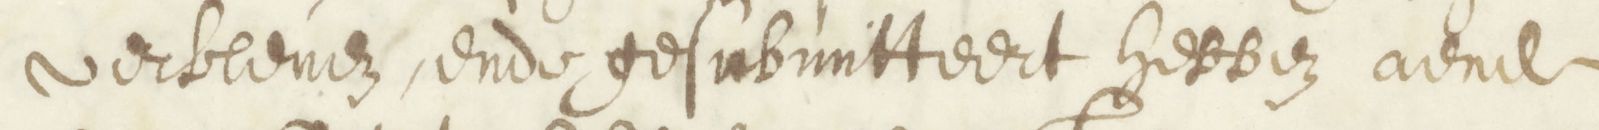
verbleuen, ende gesubmitteert hebben aende
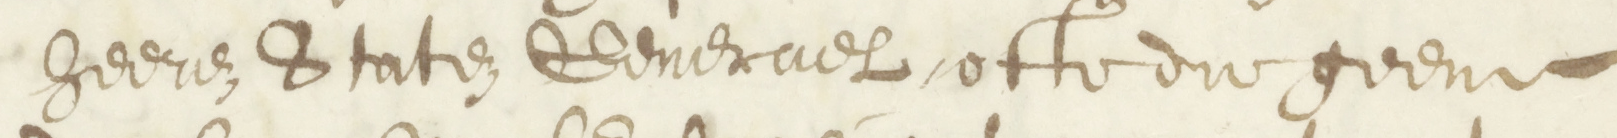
heeren Staten Generael, ofte die geene
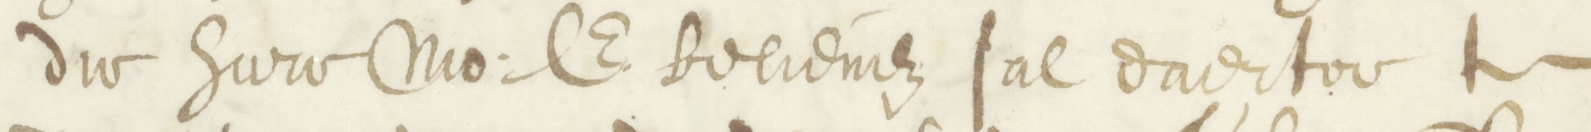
die hare mo: E belieuen sal daertoe te
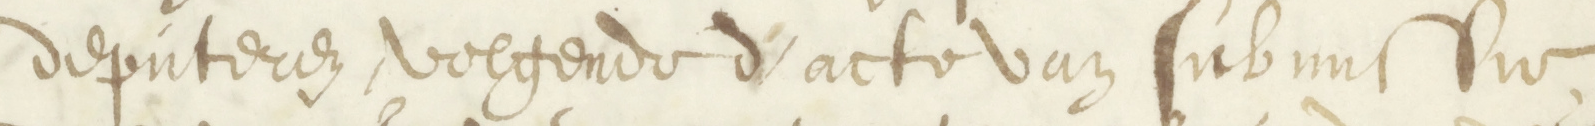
deputeren, volgende d'acte van submissie
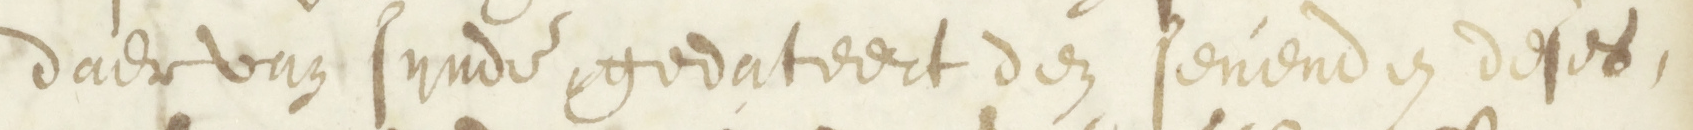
daervan synde, gedateert den seuenden deses,
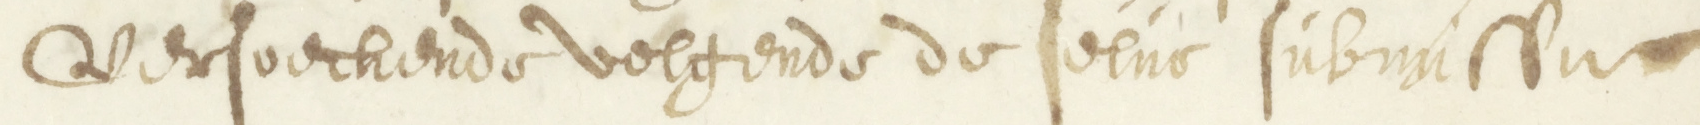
versoeckende volgende de selue submissie
